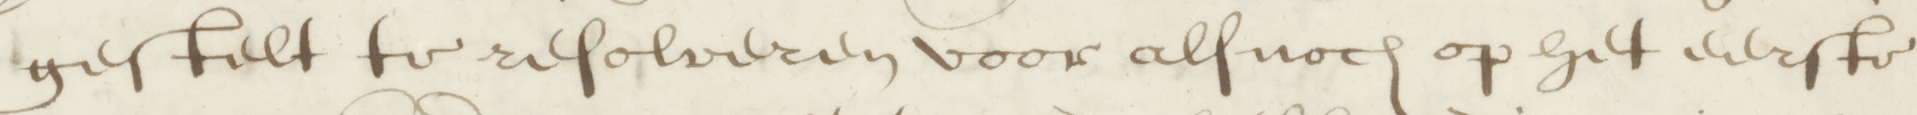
gestelt te resolveren voor alsnoch op het eerste
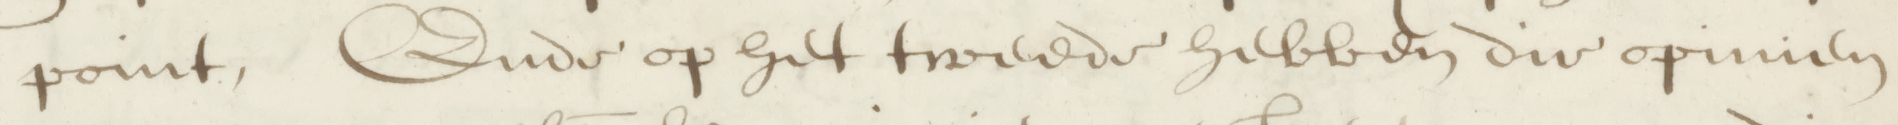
point. Ende op het tweede hebben die opinien
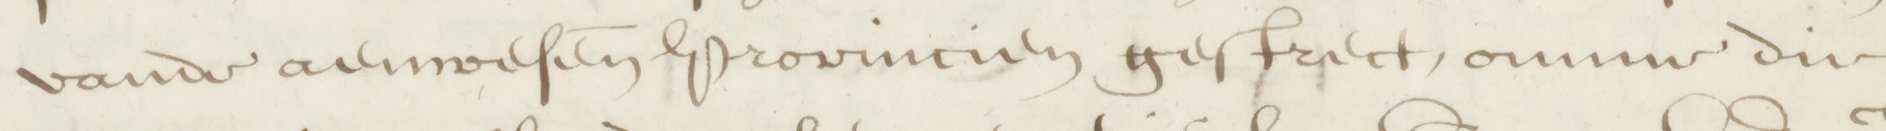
vande aenwesen Provincien gestrect, omme die
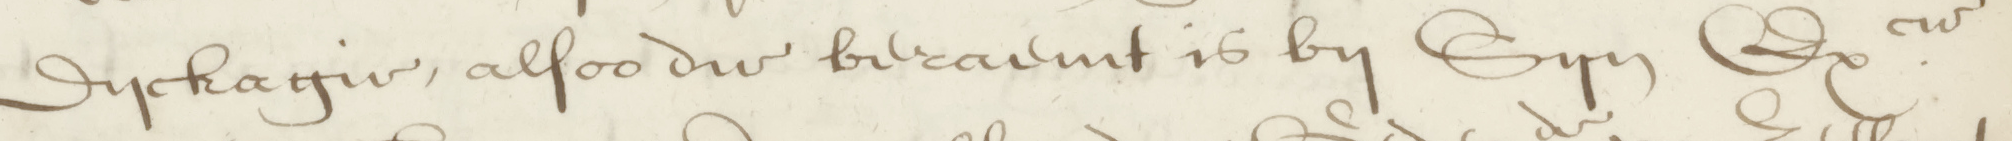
Dyckagie, alsoo die beraemt is by Sijn Excie.
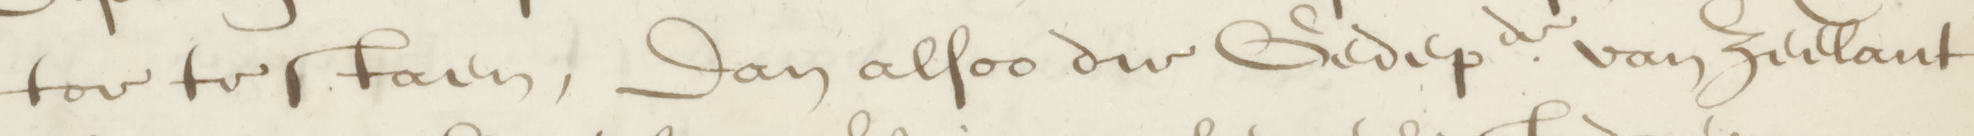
toe te staen. Dan alsoo die Gedepde. van Zeelant
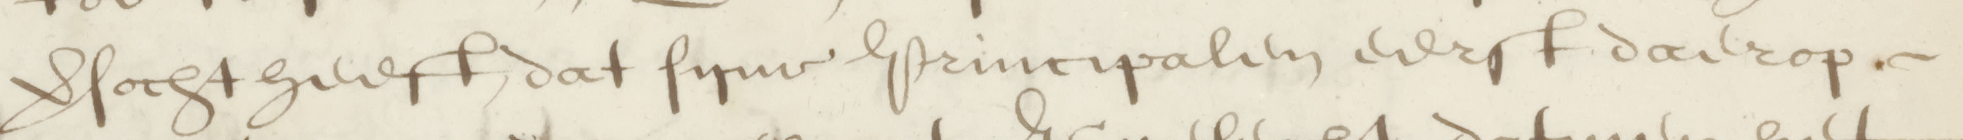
vsocht heeft, dat syne Principalen eerst daerop
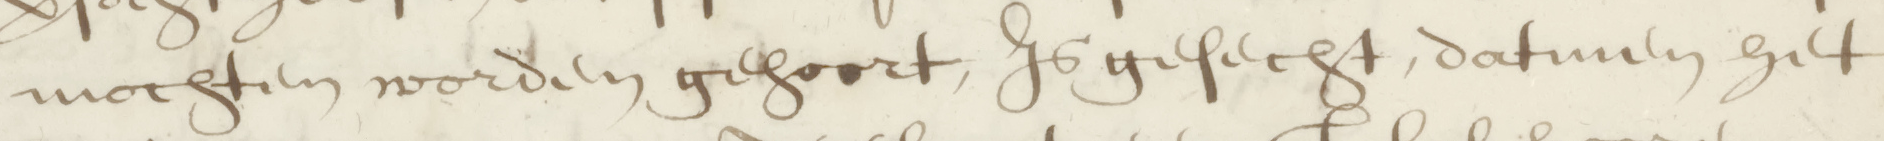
mochten worden gehoort, Is gesecht, datmen het
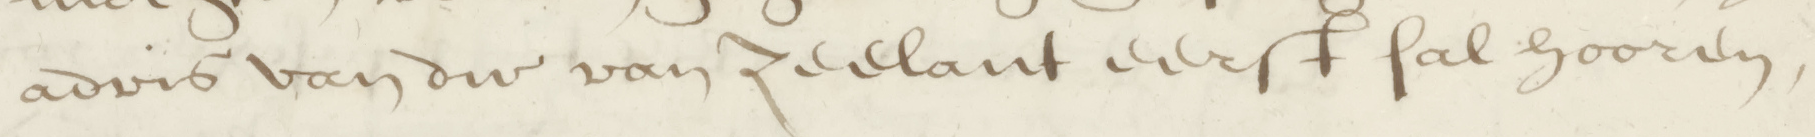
advis van die van Zeelant eerst sal hooren.
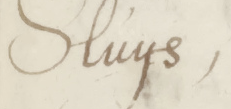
Sluys,
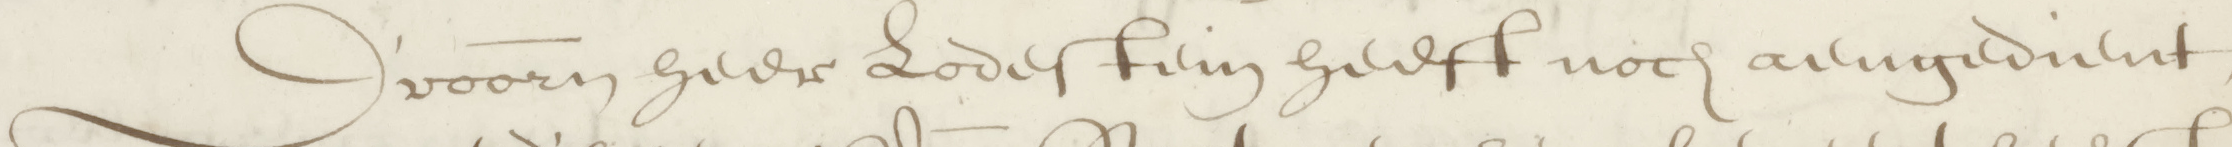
D'voorn heer Lodestein heeft noch aengedient
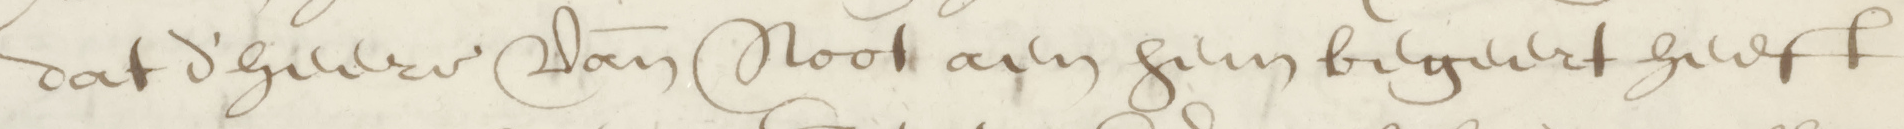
dat d'heere Van Noot aen hem begeert heeft
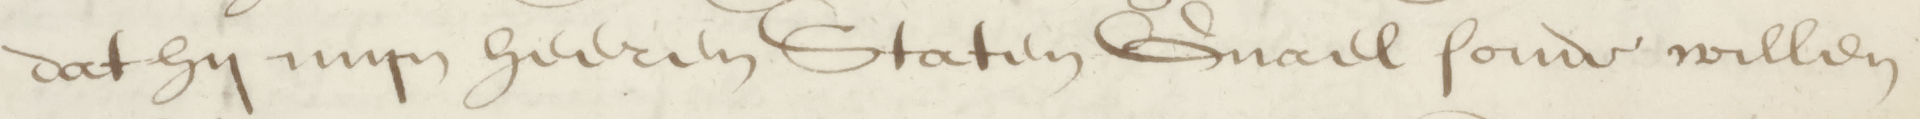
dat hy myn heeren Staten Gnael soude willen
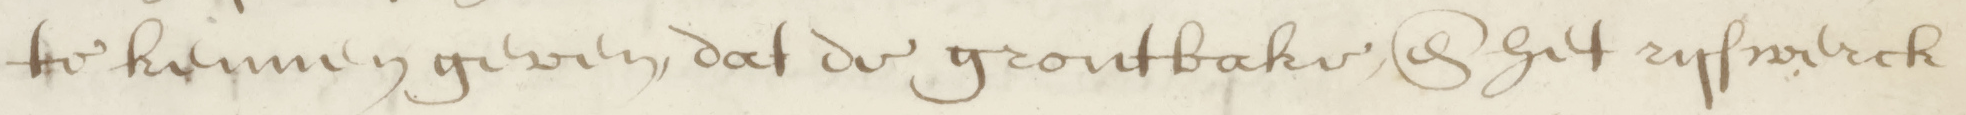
te kennen geven, dat de grontbake, & het ryswerck
